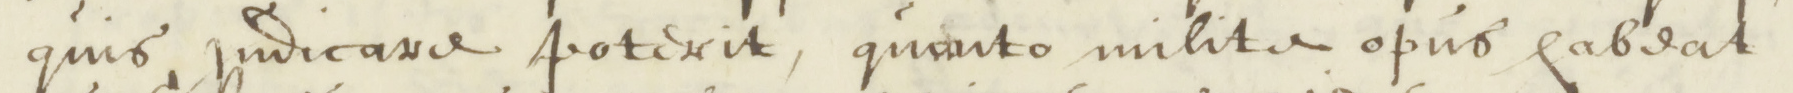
quis judicare poterit, quanto milite opus habeat
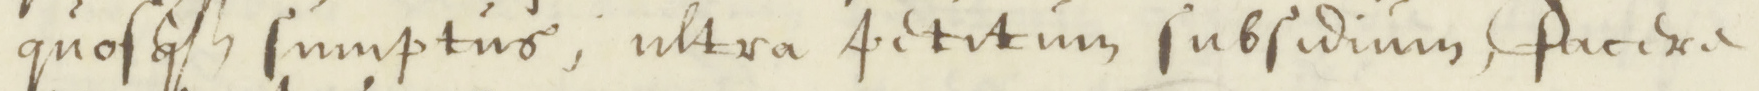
quosq sumptus, ultra petitum subsidium facere
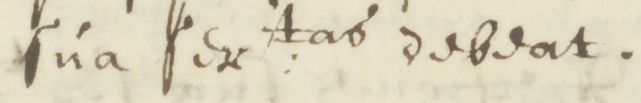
sua sertas debeat.
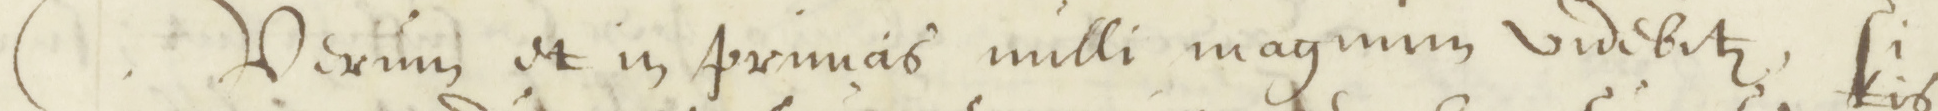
Verum et in primas milli magum videbit, si
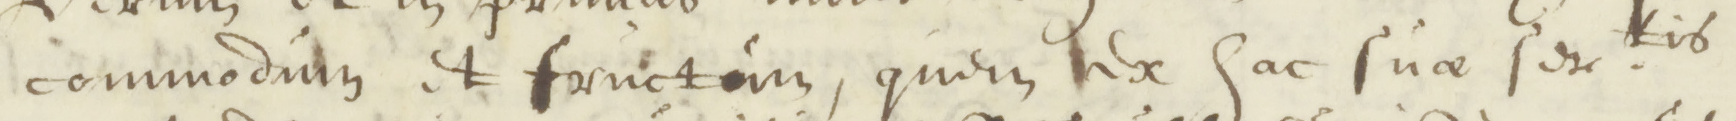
commodum et fructum, quem ex hac suæ sertis
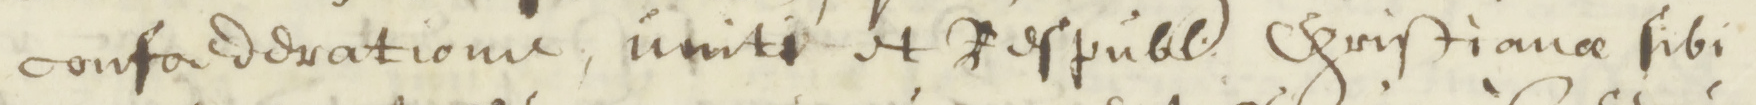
confoederatione, uniti et Respubl Cristianæ sibi
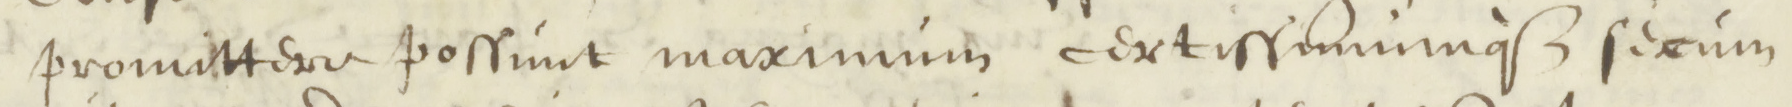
promittere possunt maximum certissimumq secum
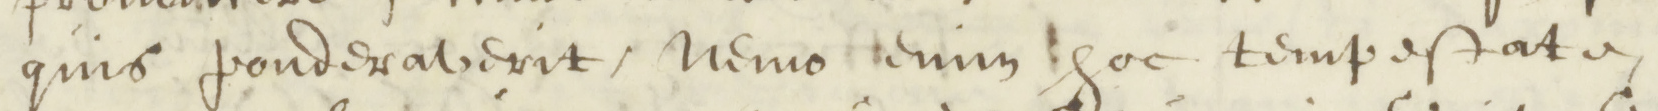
quis ponderaverit, nemo enim hoc tempestate
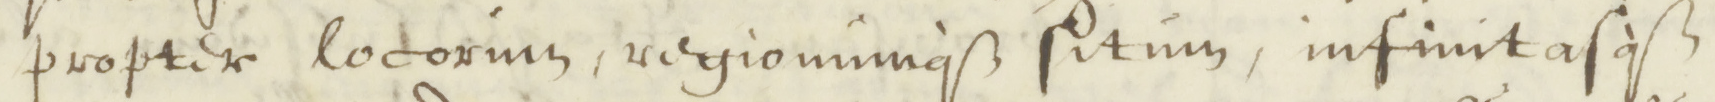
propter locorum, regionumq situm, infinitasq
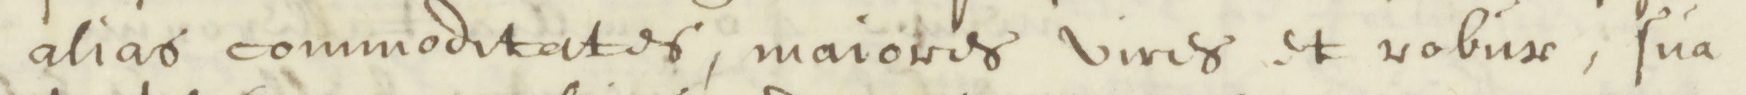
alias commoditates, maiores vires et robur, sua
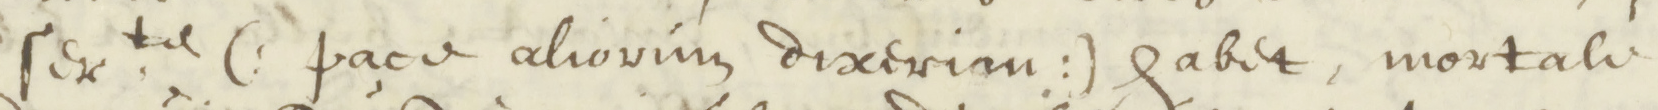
sertis (: pace aliorum dixerim:) habet, mortale ser.
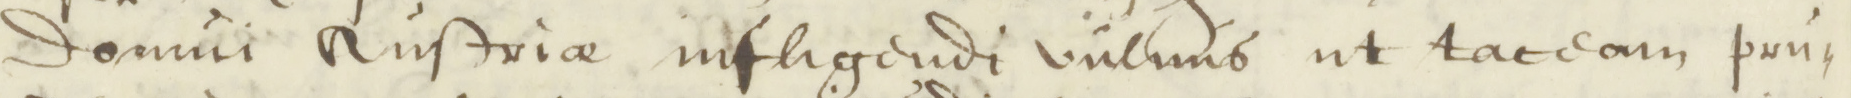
Domui Austriæ, infligendi vulnus ut taceam pru„
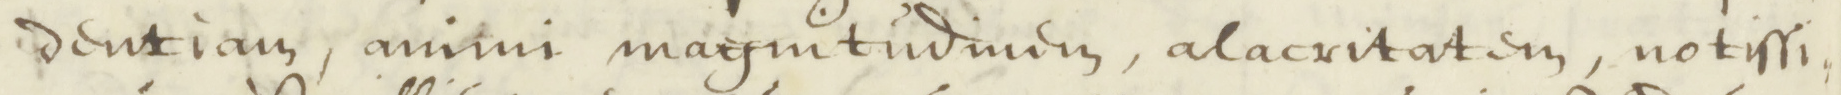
dentiam, amimi magintudinem, alacritatem, notissi„
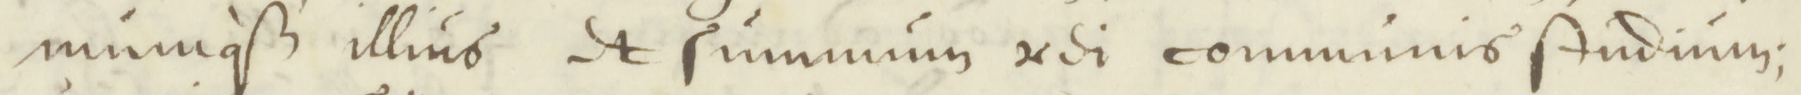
mumq illius et summum rei communis studium;
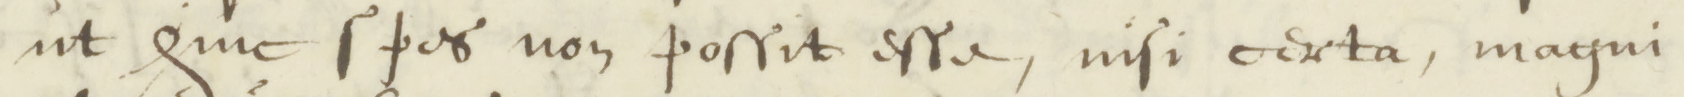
ut hinc spes non possit esse, nisi certa, magni
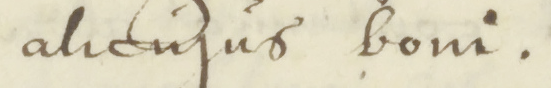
alicujus boni.
